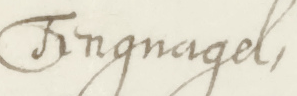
Tengnagel,
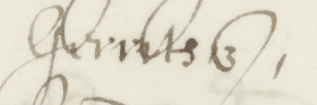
Gerritsz,
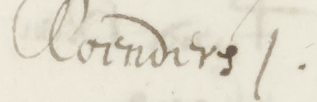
Coenders,
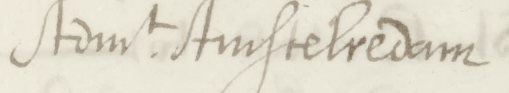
Admt Amstelredam
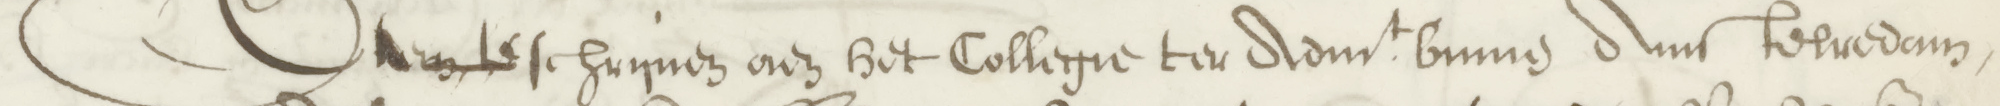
Om te schryuen aen het Collegie ter Admt. binnen Amstelredam.
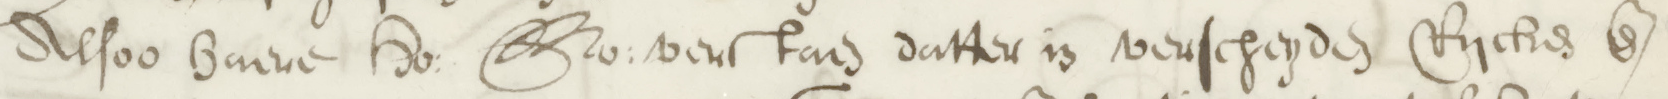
Alsoo haere Ho:Mo: verstaen datter in verscheyden Rycke &de
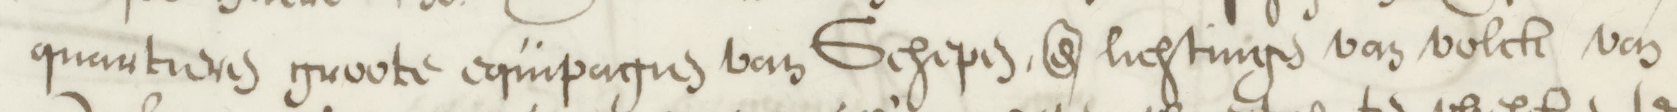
quartieren groote equipagien van Schepen & lichting van volck van
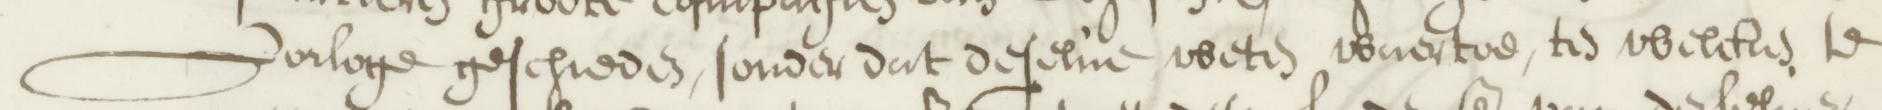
Oorloge geschieden, sonder dat deselue weten waertoe, ten welcken te
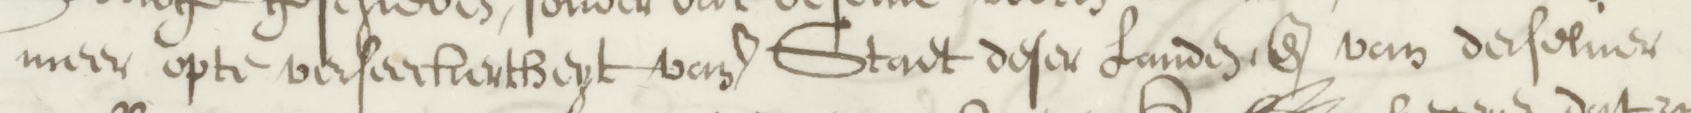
meer opte verseeckertheyt van Staet deser Landen, & van derseluer
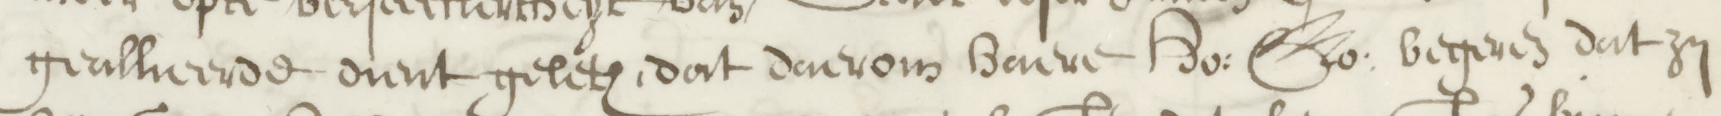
geallieerde dient geleth, dat daerom haere Ho:Mo: begeren dat zy
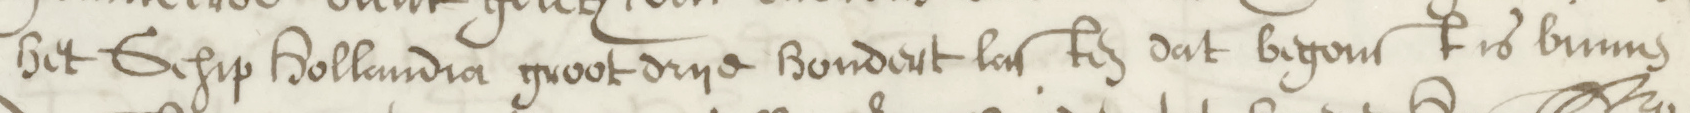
het Schip Hollandia groot drye hondert lasten dat begonst is binnen
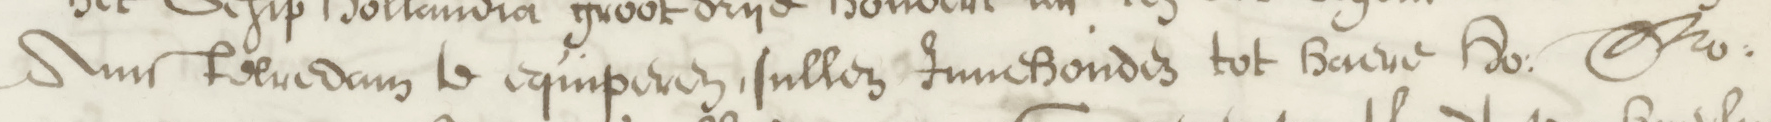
Amstelredam te equiperen, sullen Innehouden tot haere Ho:Mo:
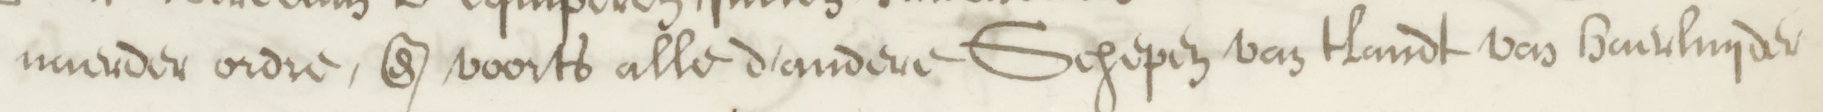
naerder ordre, & voorts alle d'andere Schepen van tlandt van haerluyder
